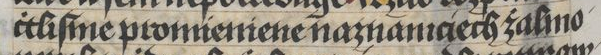ċtliſme promieniene naznamcíech żalmo¬
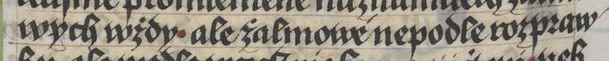wych wżdy.ale żalmowé nepodle rozpraw¬
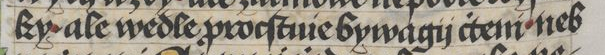ky.ale wedle ꝓrocſtvie bywagij ċteni.neb
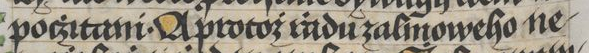pocżitani.A protoż ṙadu zalmoweho ne¬
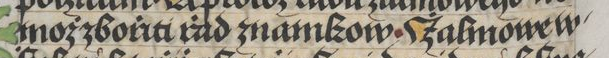moż zboṙiti ṙad znamkow.Żalmowe w¬
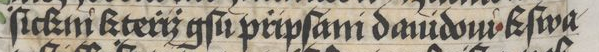ẛickni kteṙíż gſu pṙipſani davidovi.kſwa¬
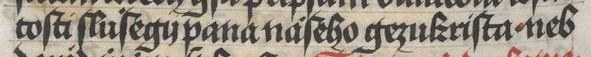toẛti ſluẛegu pana naẛeho gezukriſta.neb
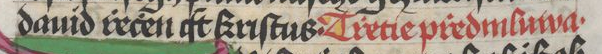david ṙeċen ḡt kriſtus.Tṙetie pṙedmluwa.
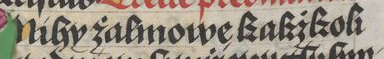nihy żalmowe kakżkoli
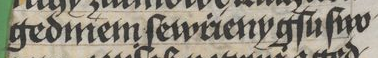gedniem ſewříeny gſu ſvo¬
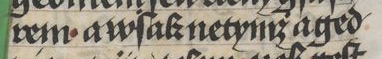rem.a wẛak netymż a ged¬
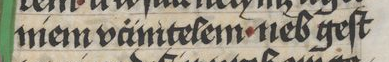niem uċinitelem.neb geſt
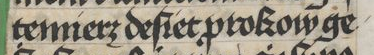temierz deſiet ꝓrokow ge¬
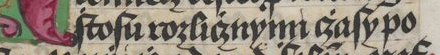ẛtoſu rozlicžnymi cżaſy po¬
